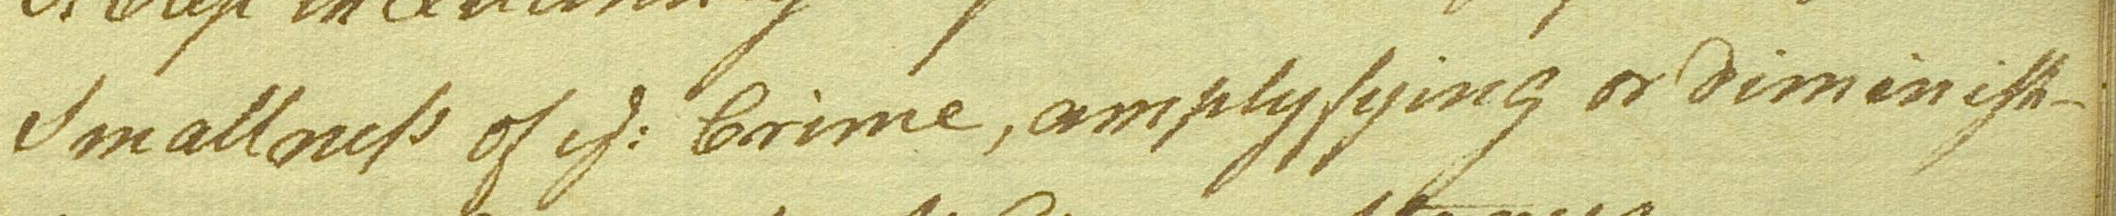Smallness of y^e Crime, amplyfying or diminish-
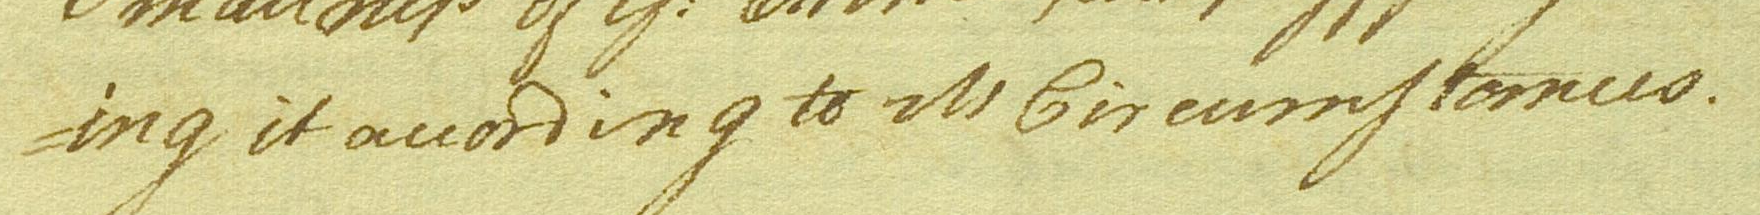-ing it according to its Circumstances.
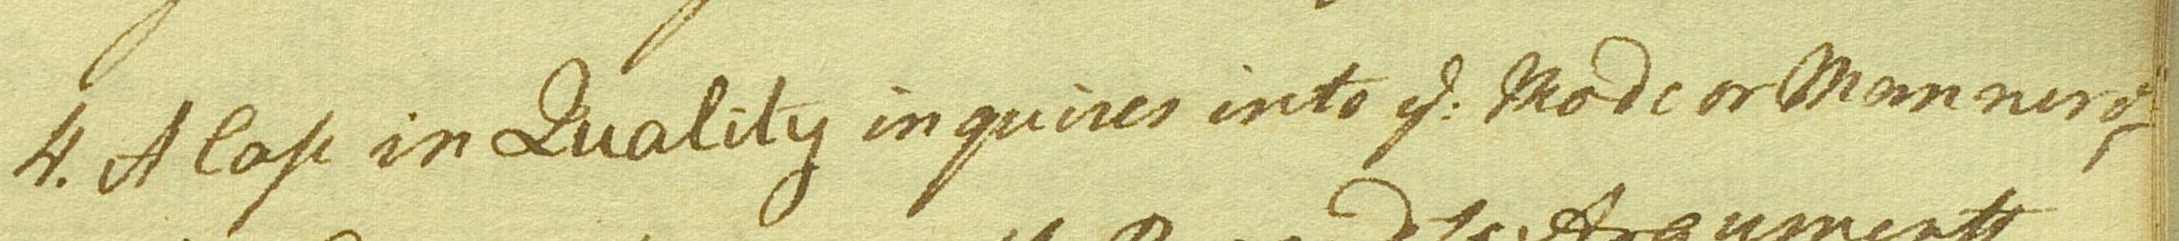4. A Case in Quality inquires into y^e: Mode or Manner of
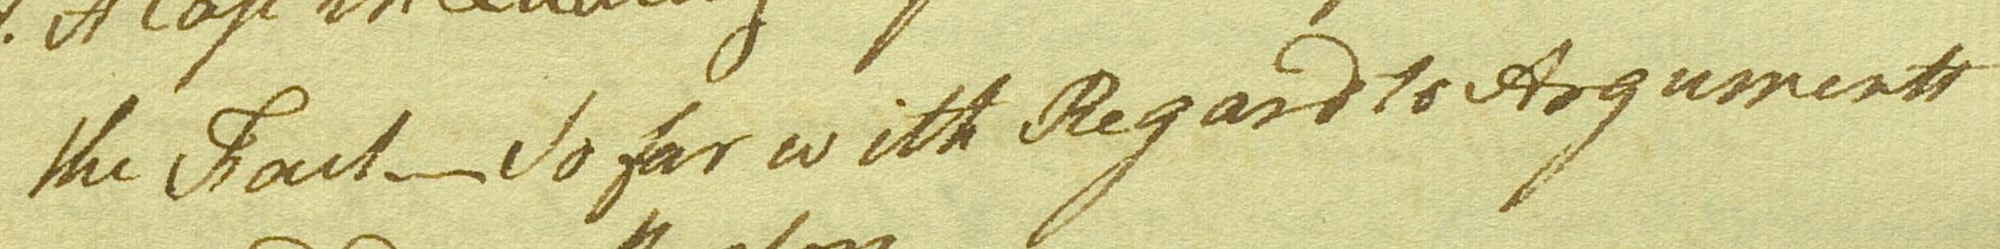the Foul- So far with Regard to Arguments
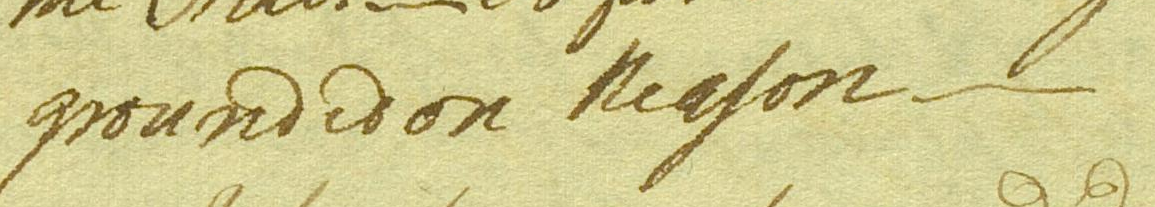grounded on reason-
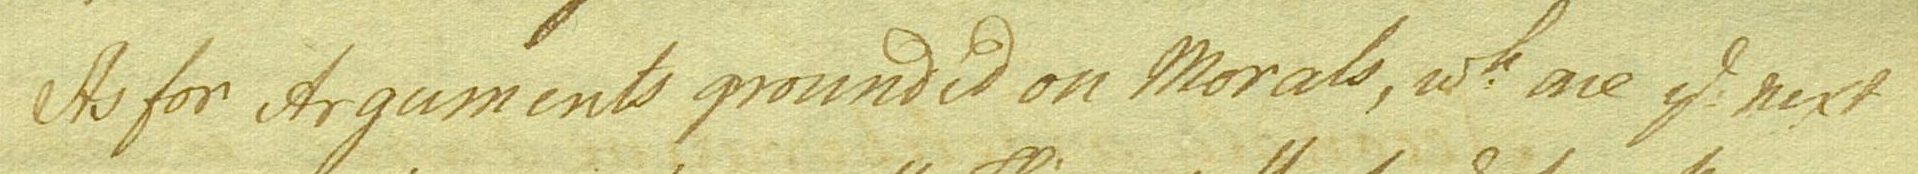As for Arguments grounded on Morals, w^h are y^e next
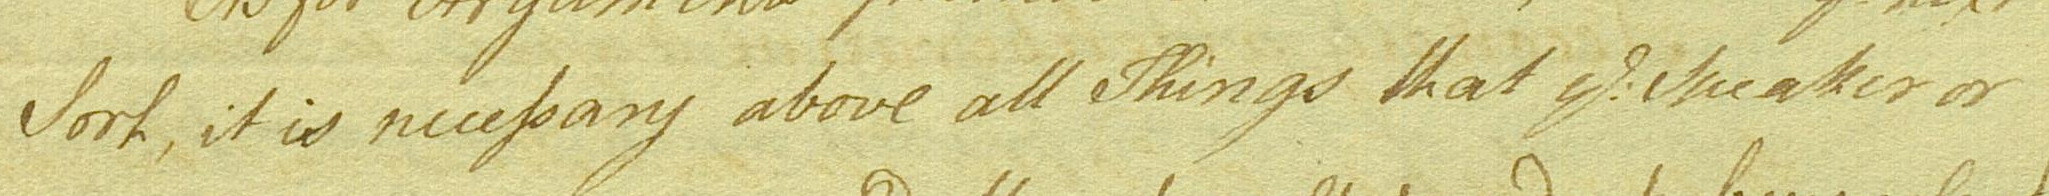Sort, it is necessary above all Things that y^e: Speaker or
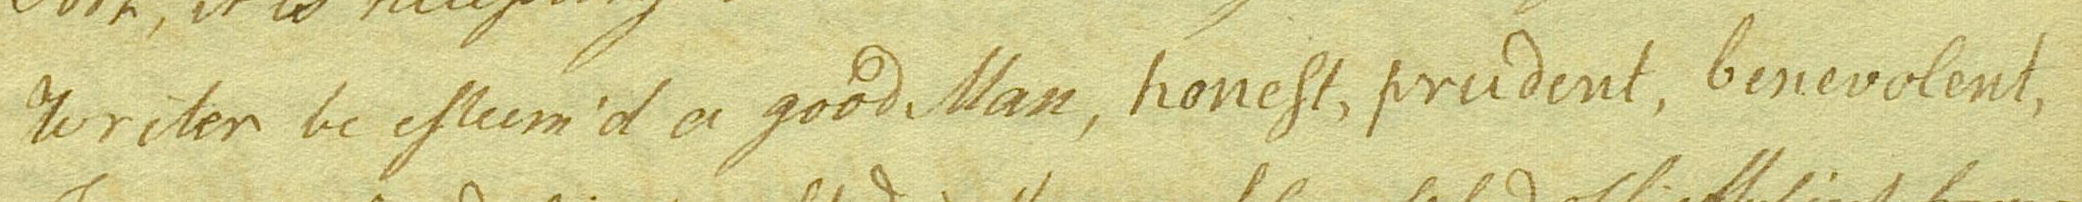Writer be esteem'd a good Man, honest, prudent, benevolent,
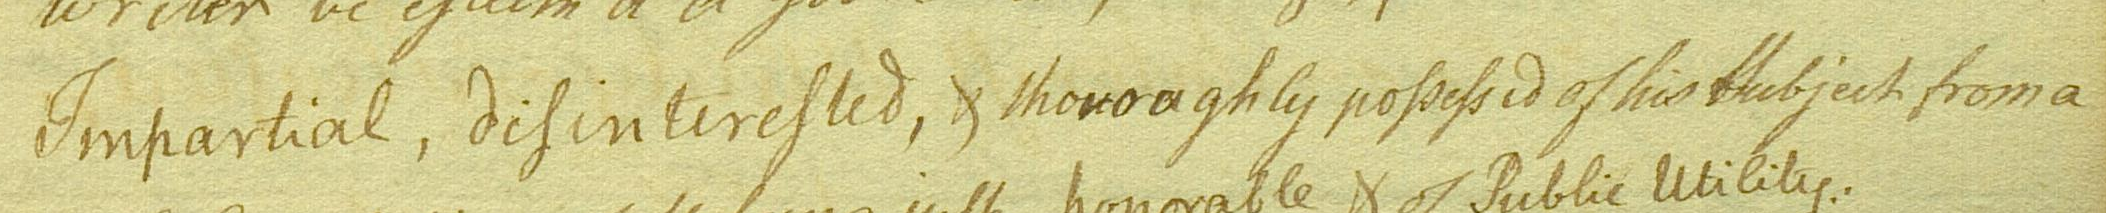Impartial, disinterested, & thoroughly possessed of this Subject from a
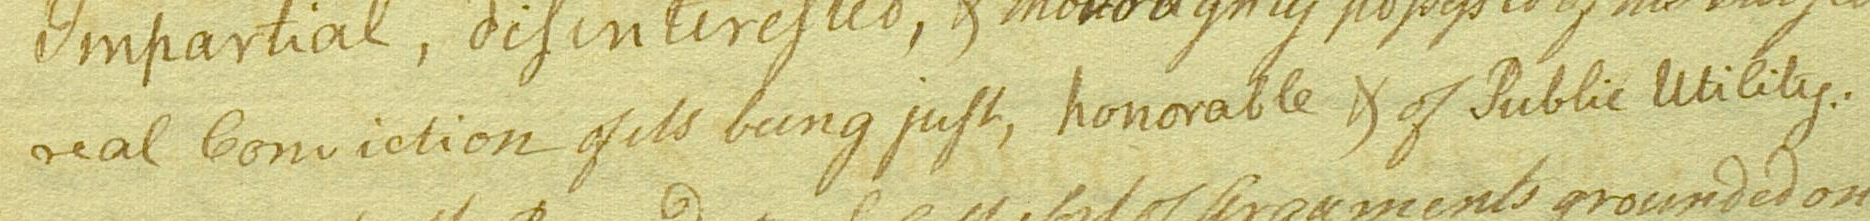real Conviction of its being just, honorable & of Public Utility.
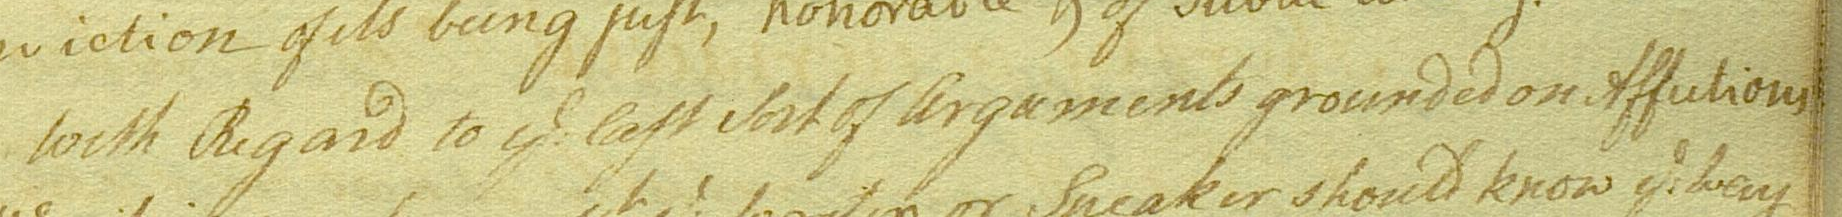With Regard to y^e: last Sort of Arguments grounded on Affections
